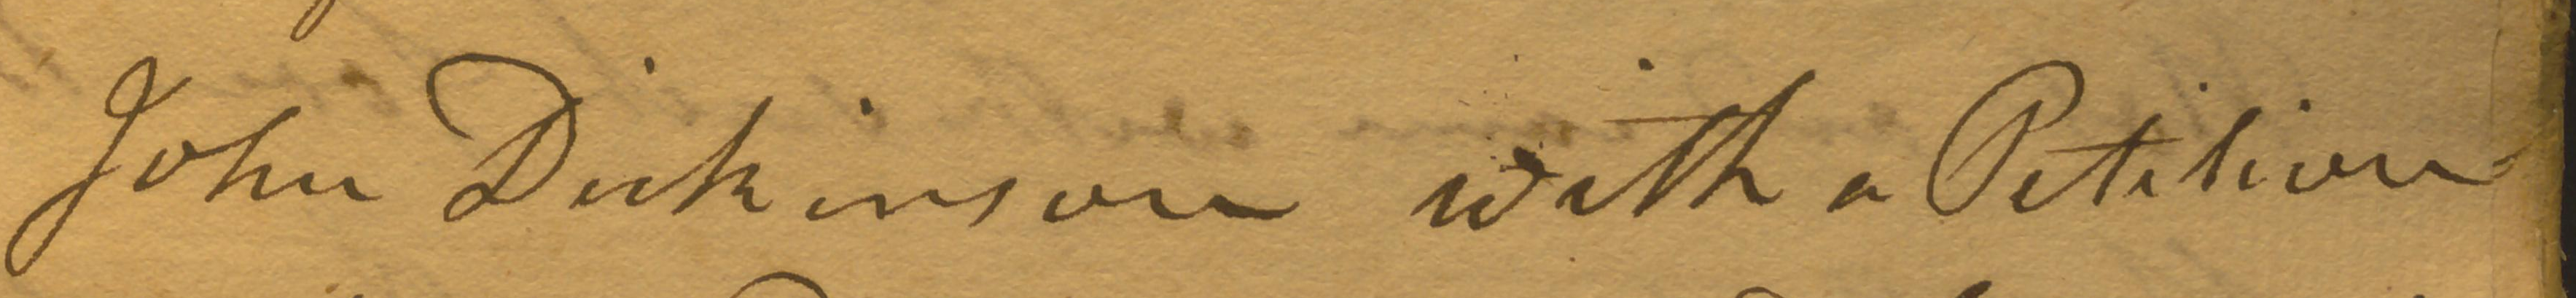John Dickinson with a Petition
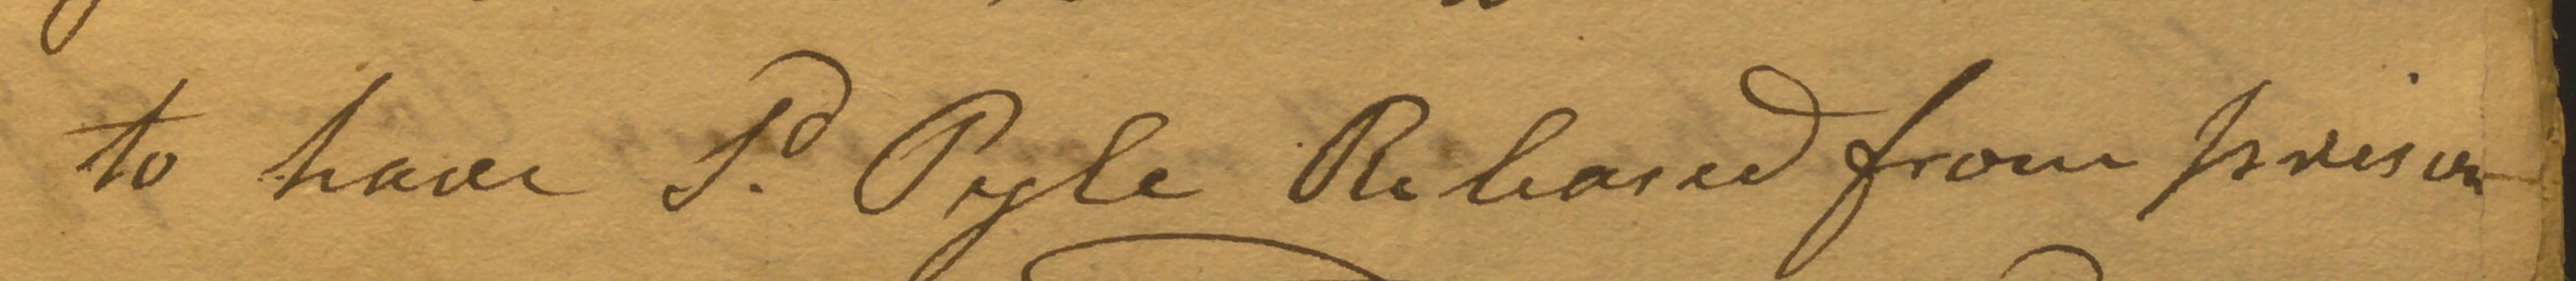to have s^d. Pyle Released from prison
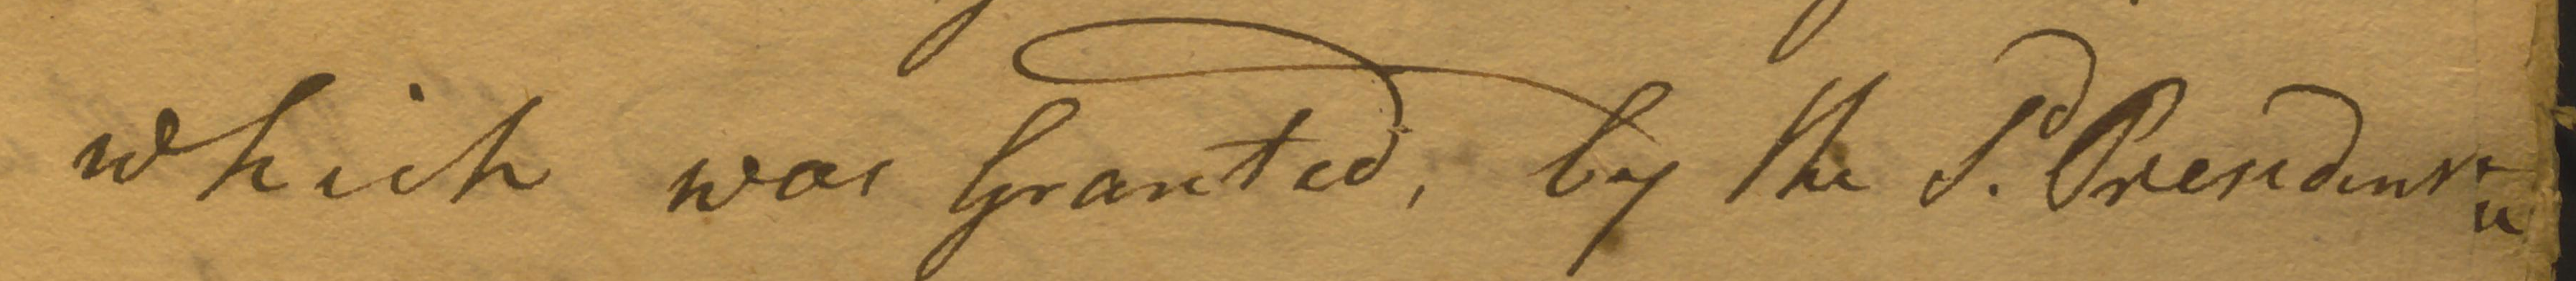which was Granted, by the s^d. President
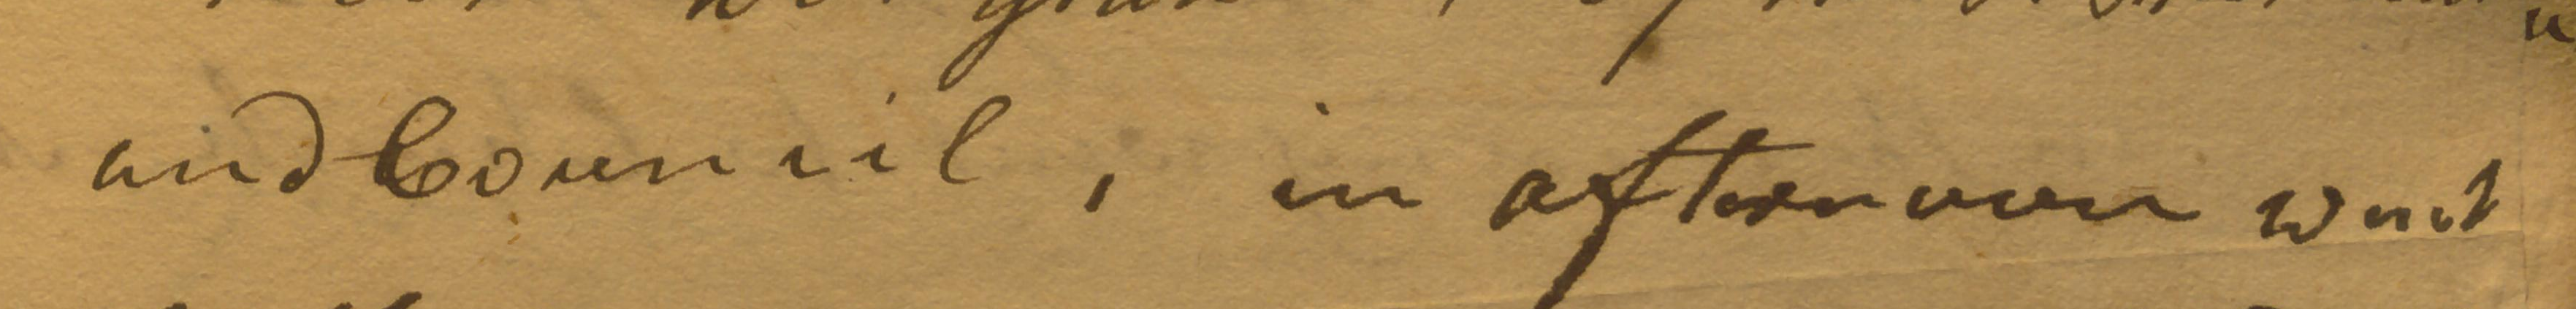and Council, in afternoon went
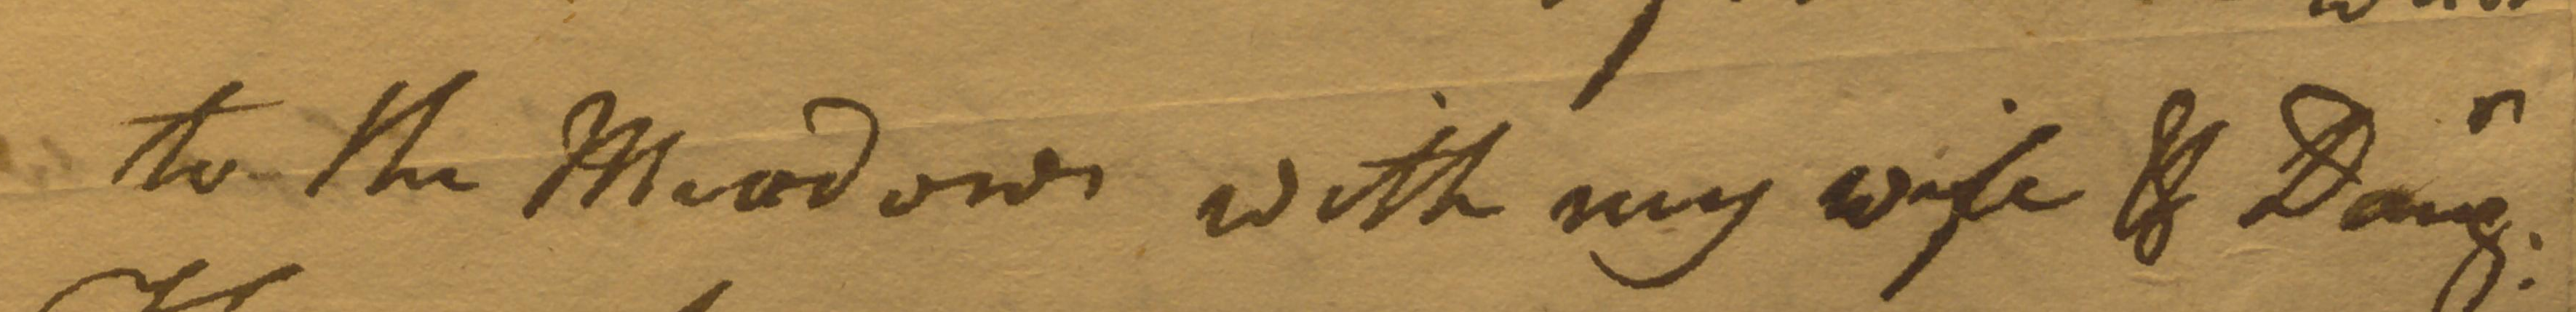to the Meadow with my wife & Daug^r:
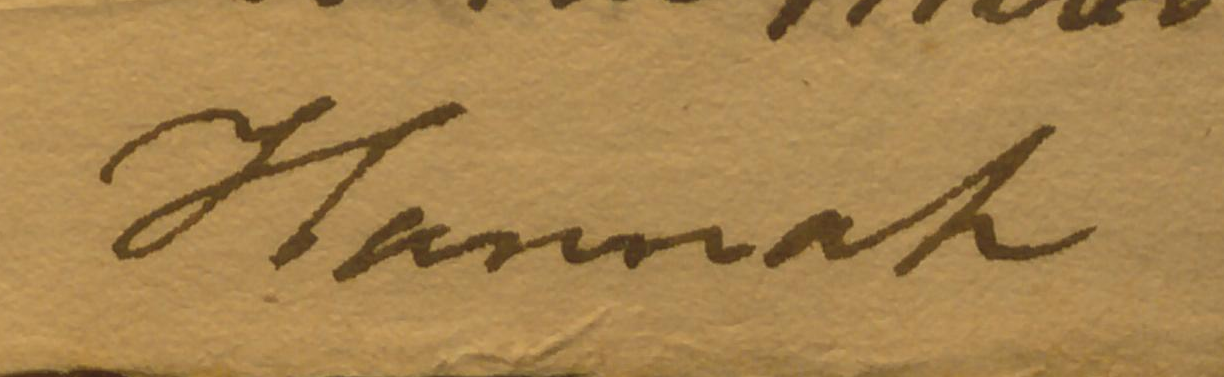Hannah
